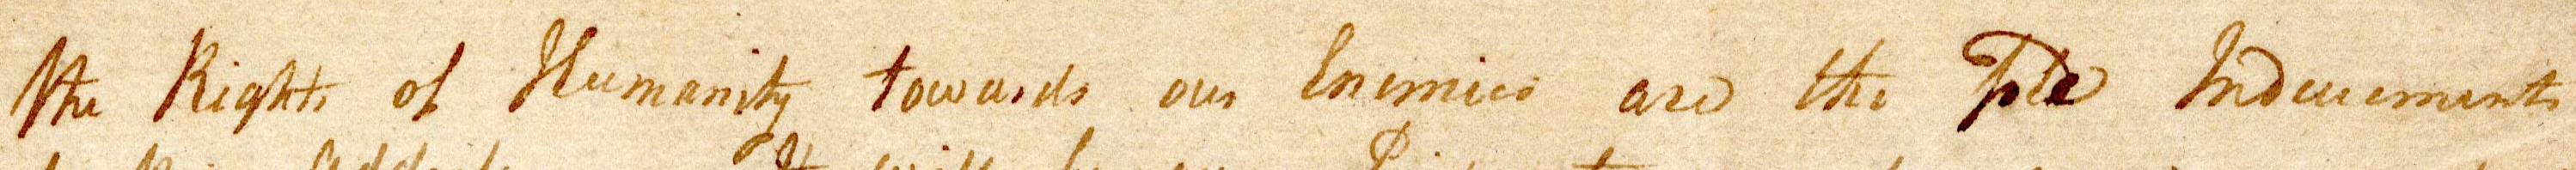the Rights of Humanity towards our Enemies are the sole Inducement
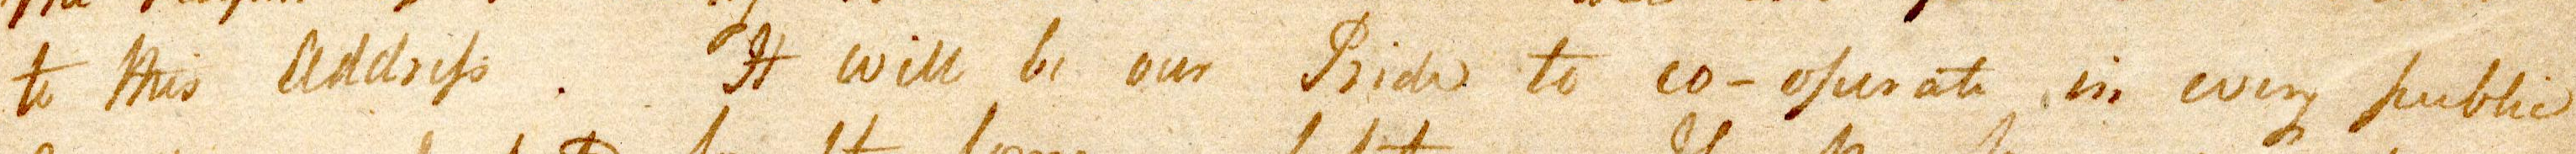to this Address. It will be our Pride to co-operate in every public
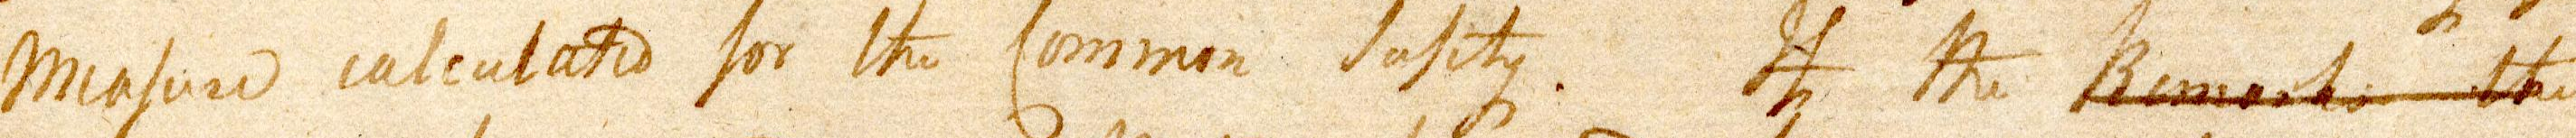Measure calculated for the Common Safety. If the Remark the
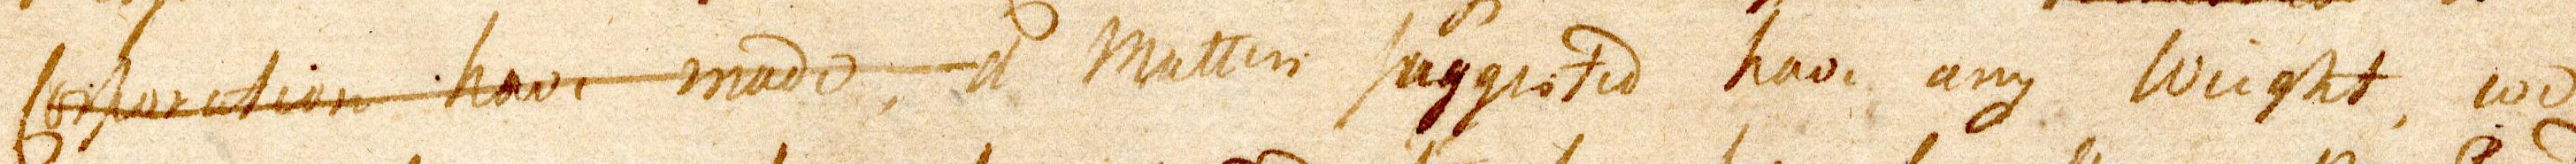[Corporation have made] d Matters suggested have any Weight, we
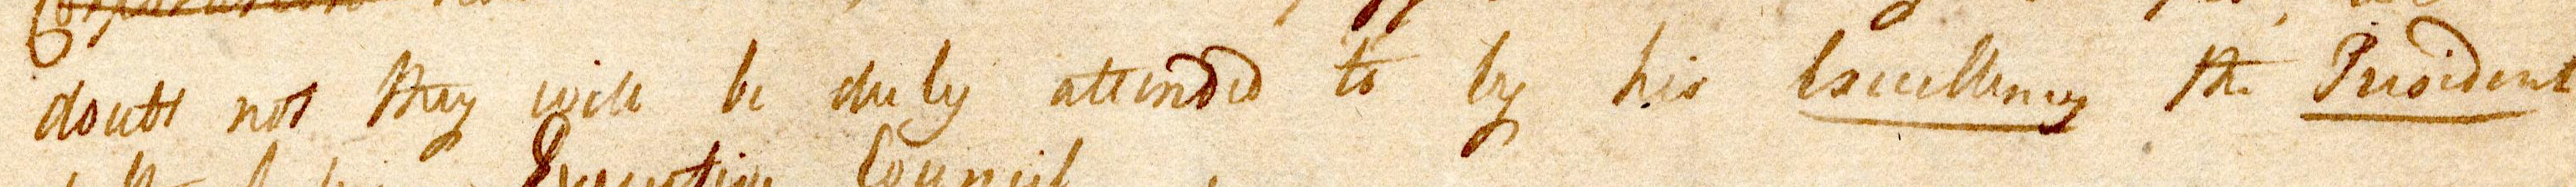doubt not they will be duly attended to by his Excelling the President
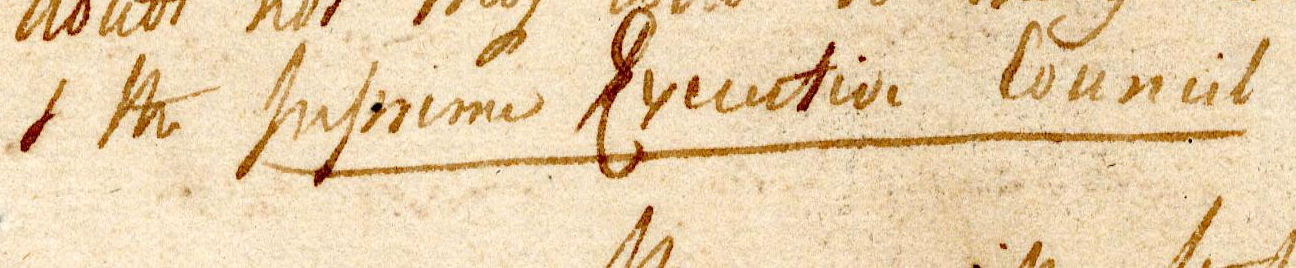& the Supreme Executive Council
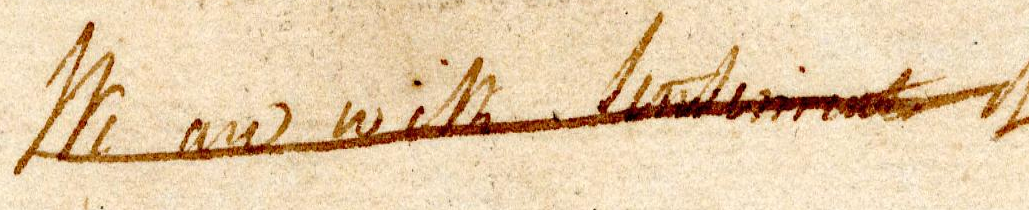We are with Sentiments of
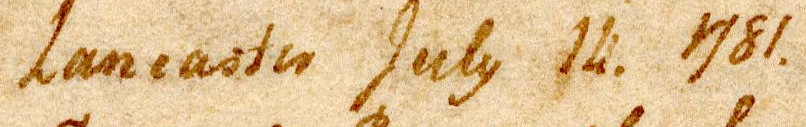Lancaster July 14. 1781
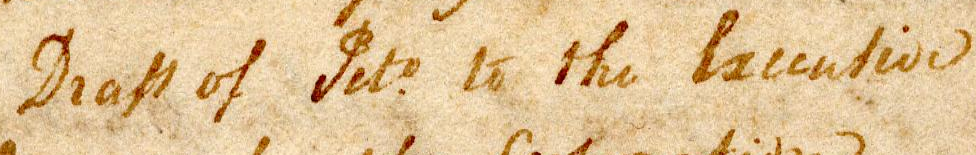Draft of Pet^o. to the Executive
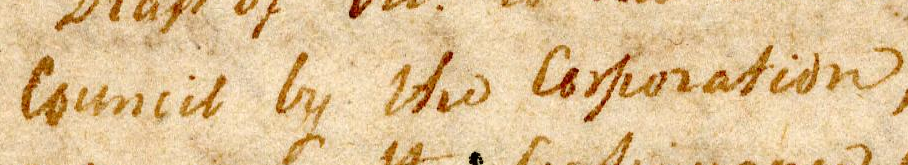Council by the Corporation,
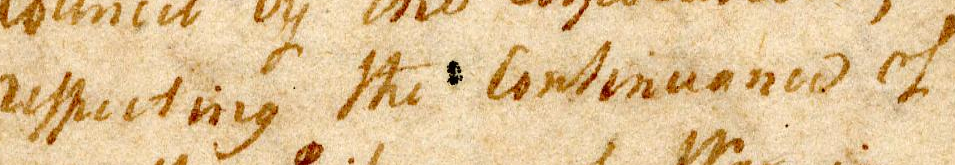respectng the Continuance of
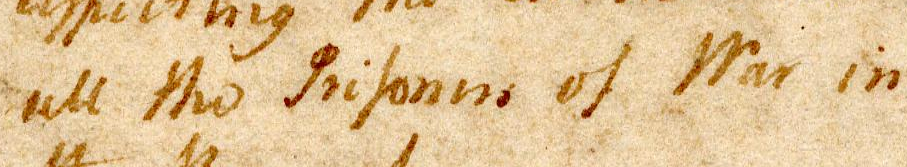all the Prisoners of War in
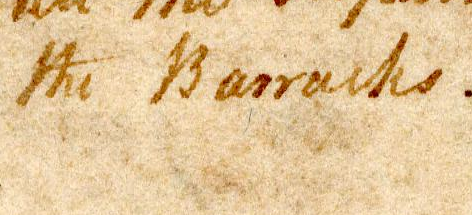the Barracks
